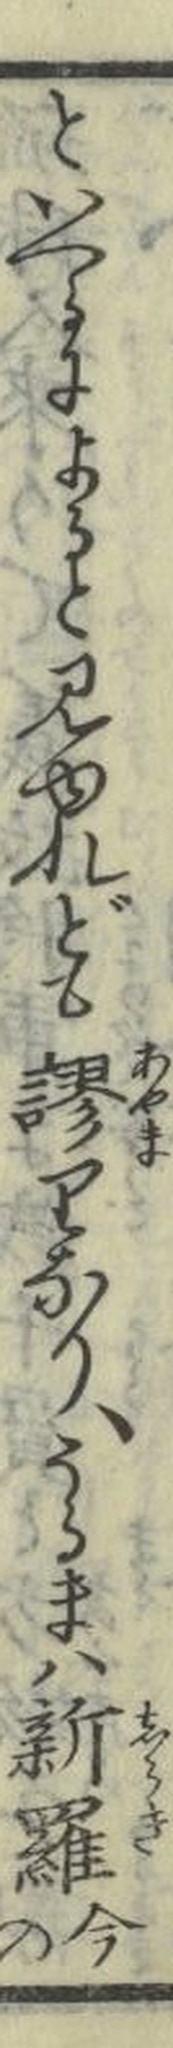といへるによると見ゆれども謬りなり、うるまは新羅今の
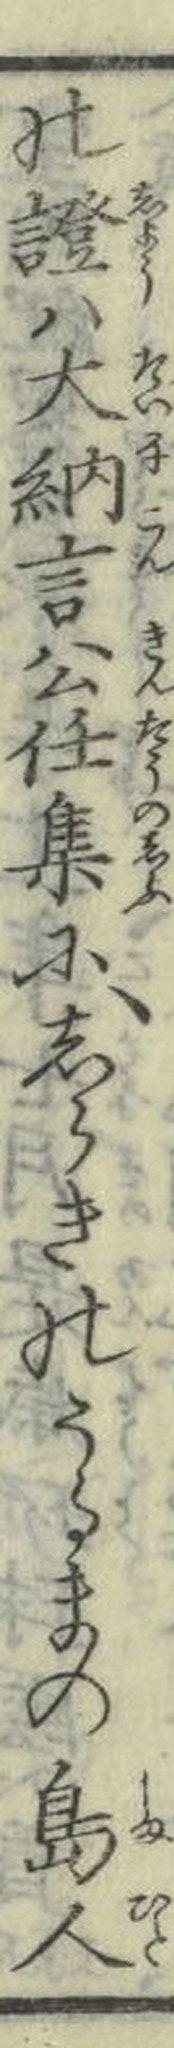の証は大納言公任集に、しらきのうるまの島人
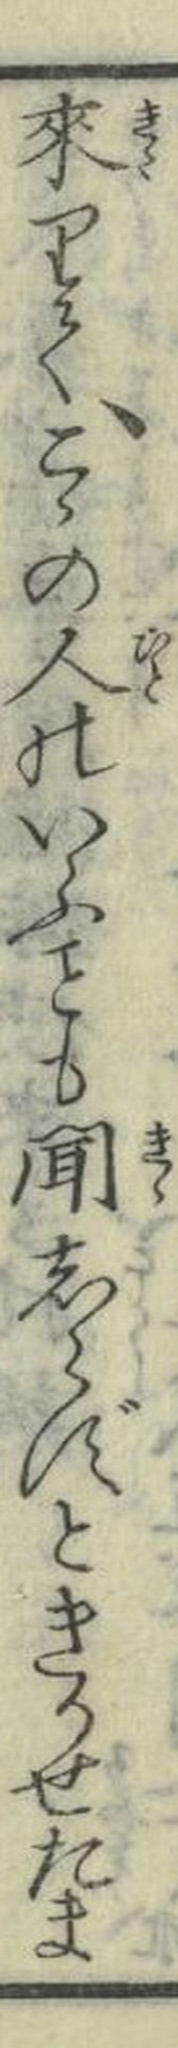来りて、こゝの人のいふことも聞しらずときかせたま
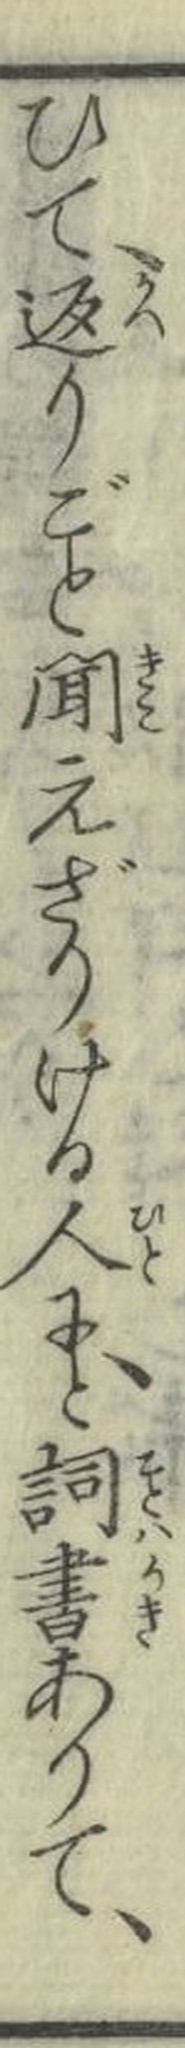ひて、返りごと聞えざりける人に、と詞書ありて、
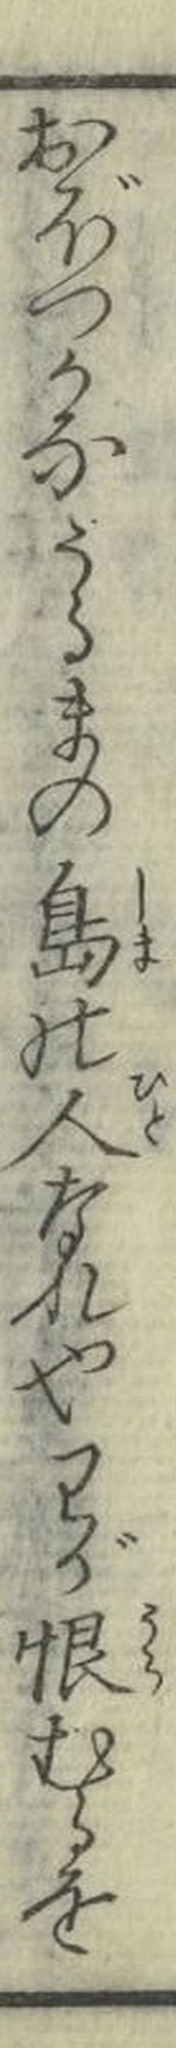おぼつかなうるまの島の人なれやわが恨むるを

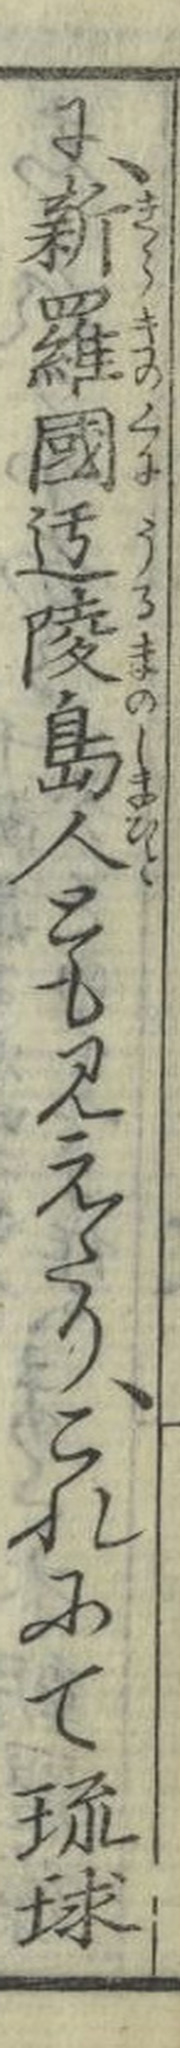に、新羅国迂陵島人とも見えたり、これにて琉球
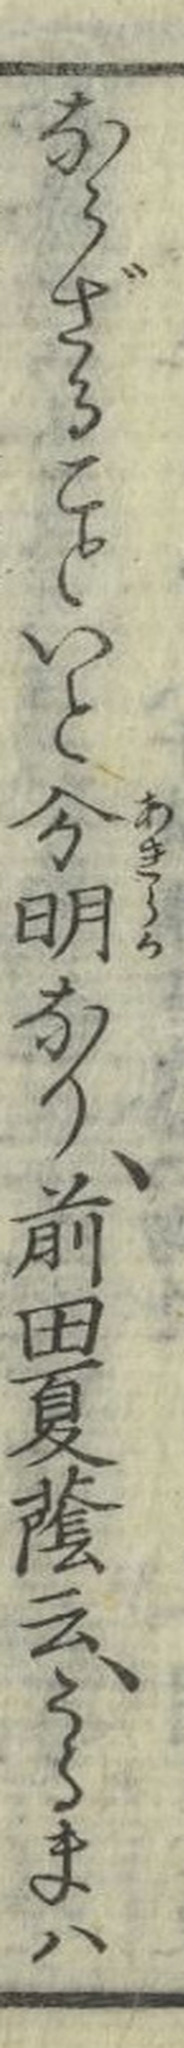ならざることいと分明なり、前田夏蔭云、うるまは
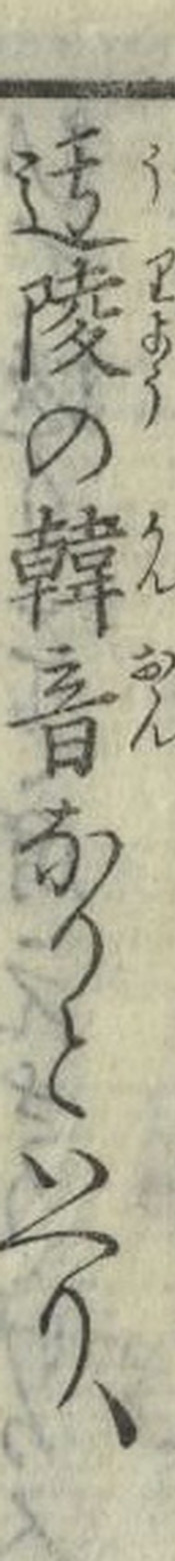迂陵の韓音なりといへり、
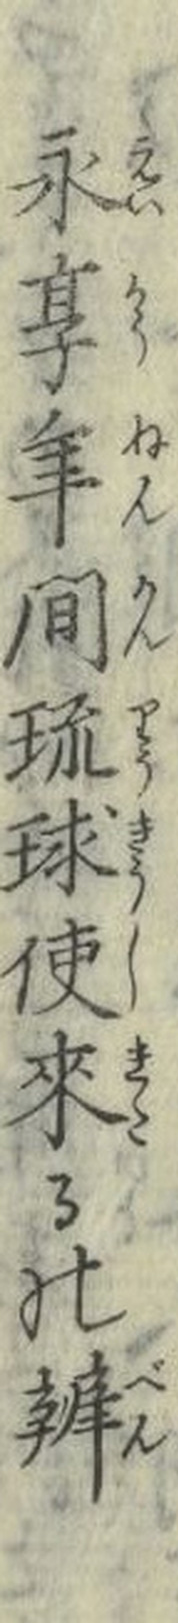永享年間琉球使来るの弁
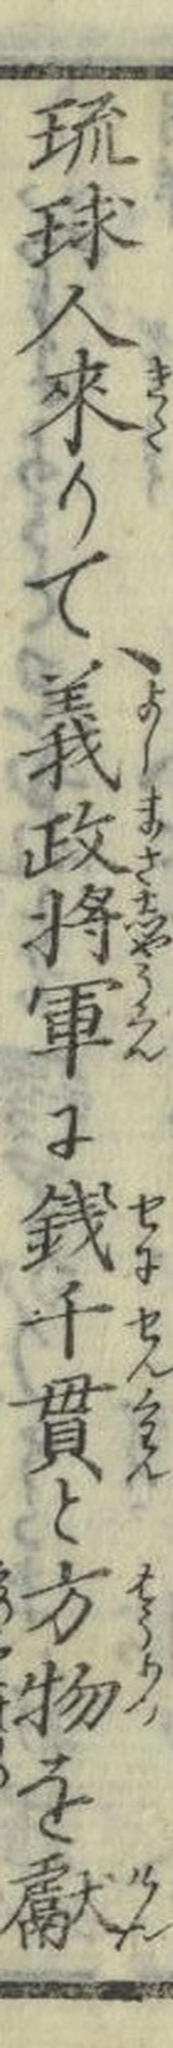琉球人来りて、義政将軍に銭千貫と方物を献
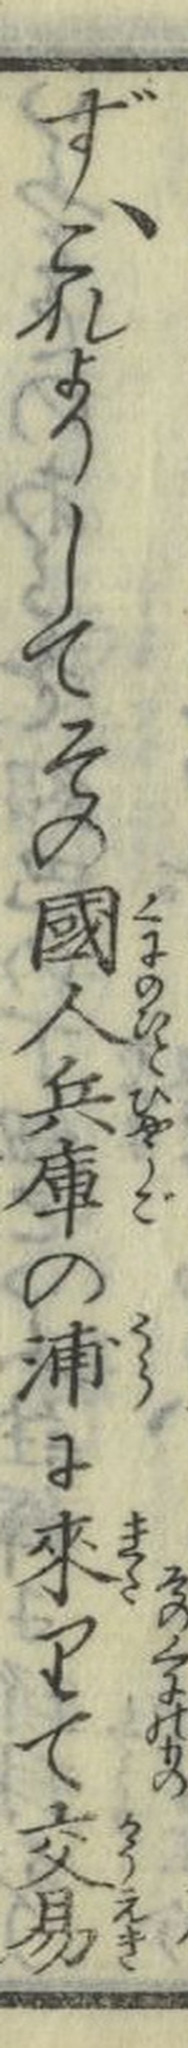ず、これよりしてその国人兵庫の浦に来りて交易
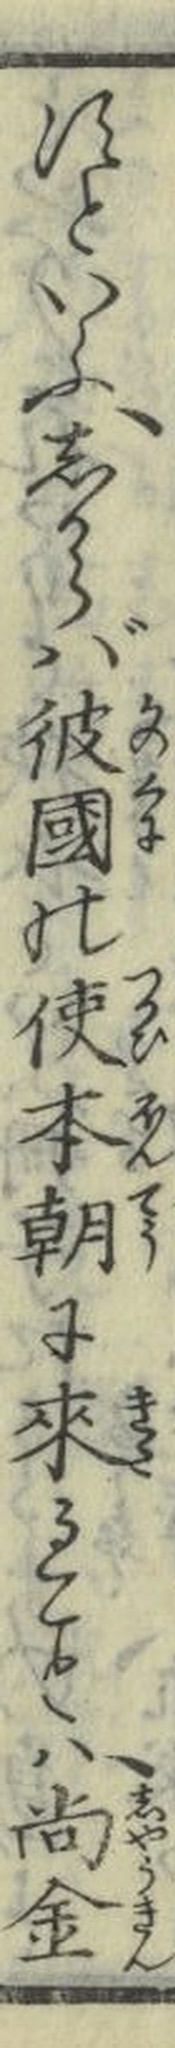すといふ、しからば彼国の使本朝に来ることは、尚金
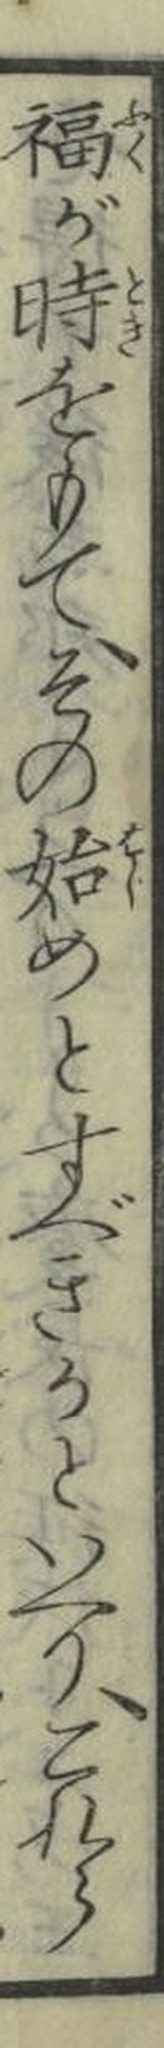福が時をもて、その始めとすべきかといへり、これら
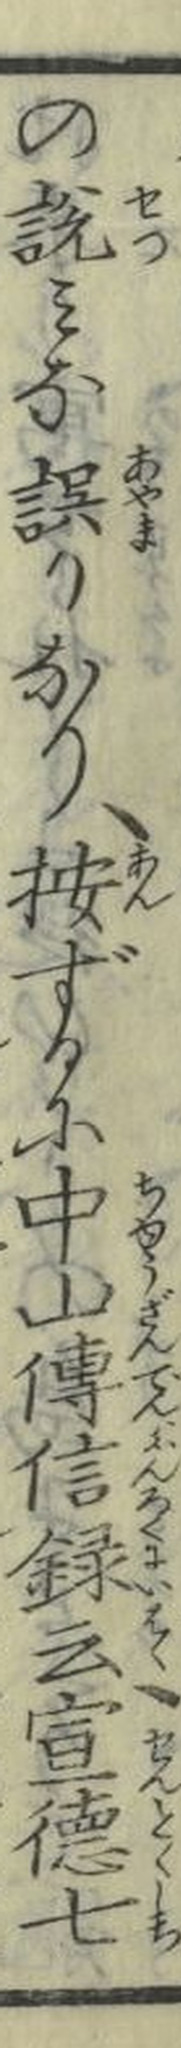の説みな誤りなり、按ずるに中山伝信録云、宣徳七
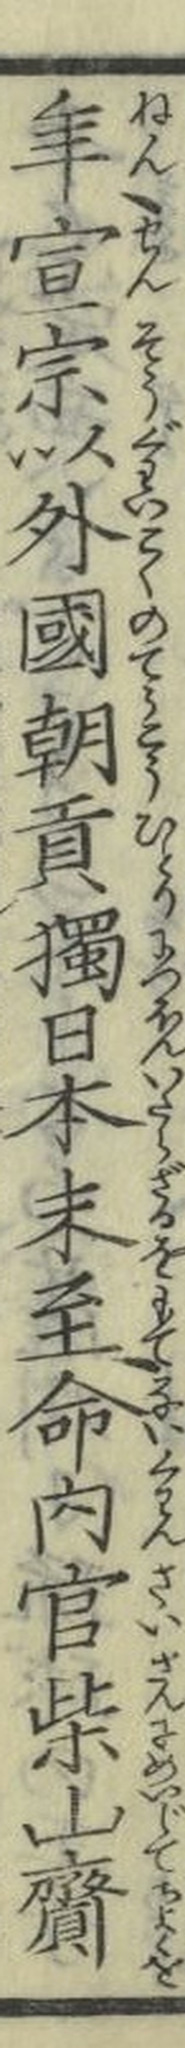年、宣宗以外国朝貢独日本未至、命内官柴山齎
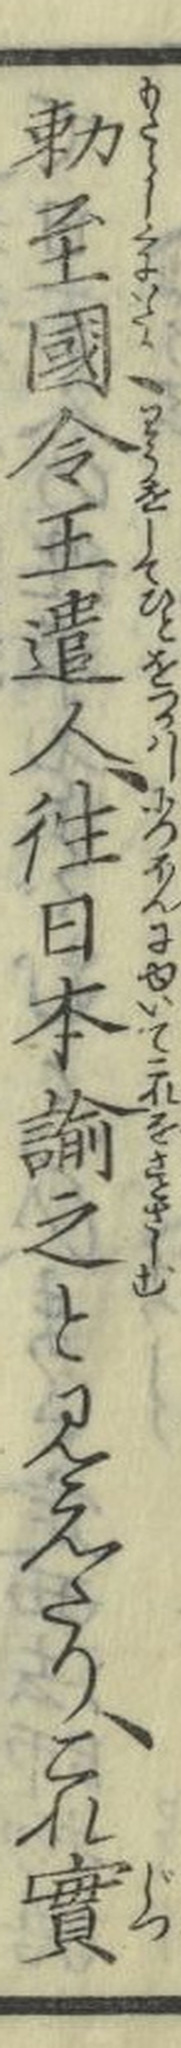勅至国、令王遣人、往日本諭之と見えたり、これ実
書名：琉球入貢紀畧
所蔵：University of the Ryukyus Library
